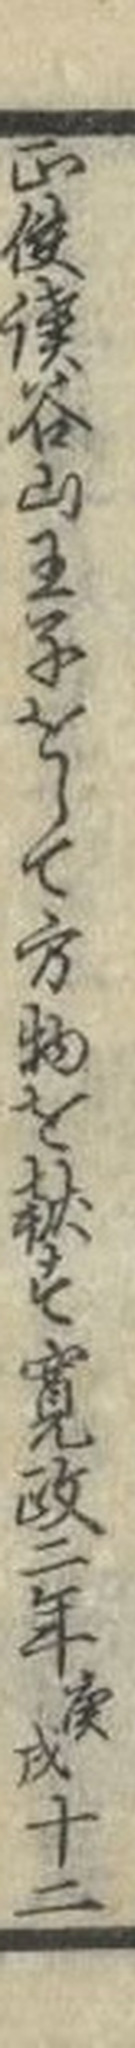正使読谷山王子をして方物を献す寛政二年庚戌十二
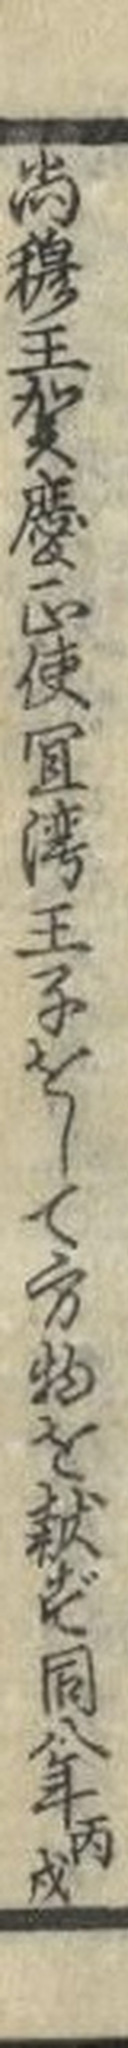尚穆王賀慶正使宜湾王子をして方物を献ず同八年丙戌

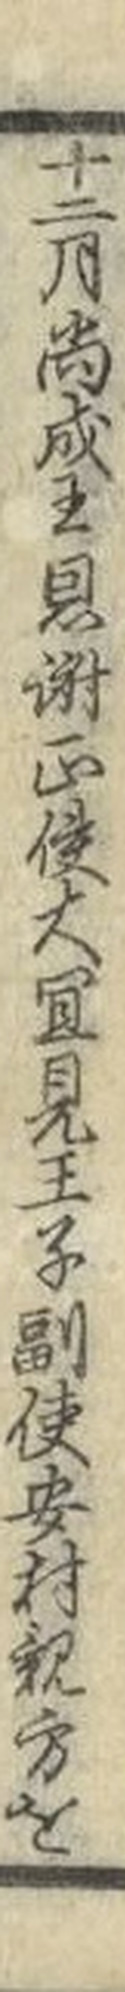十二月尚成王恩謝正使大宜見王子副使安村親方を
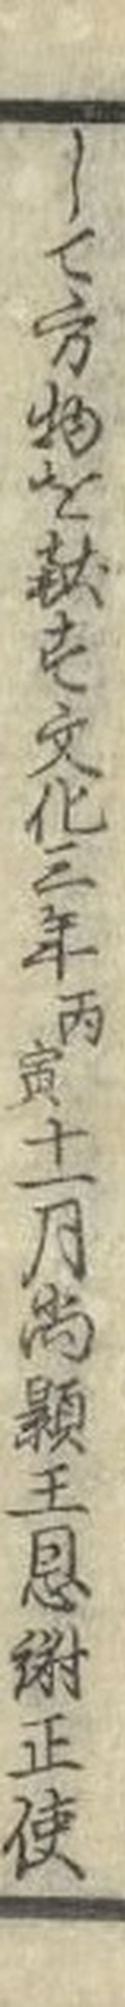して方物を献す文化三年丙寅十一月尚顥王恩謝正使
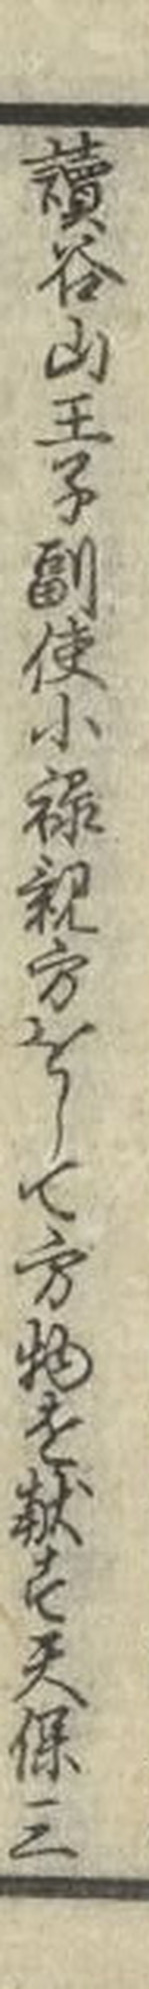読谷山王子副使小禄親方をして方物を献す天保三
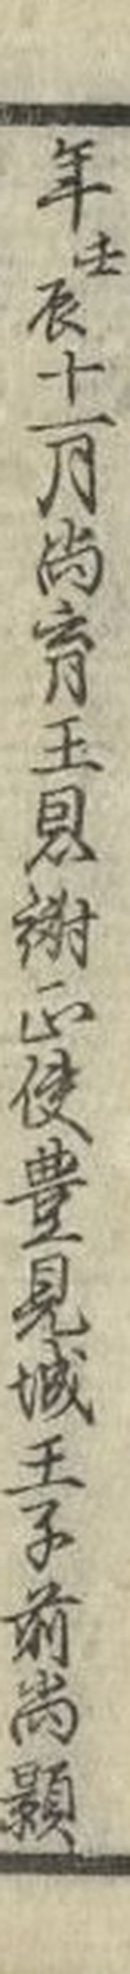年壬辰十一月尚育王恩謝正使豊見城王子前尚顥
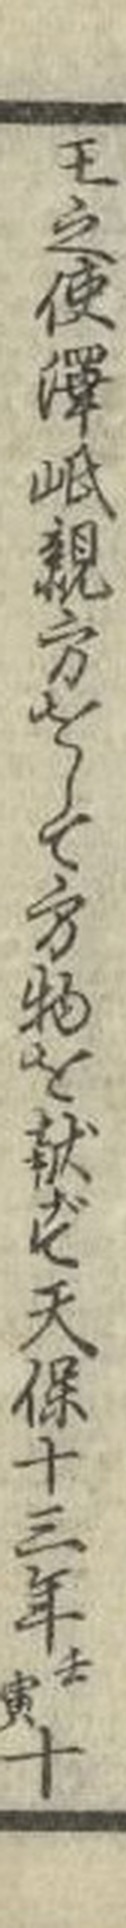王之使沢岻親方をして方物を献ず天保十三年壬寅十
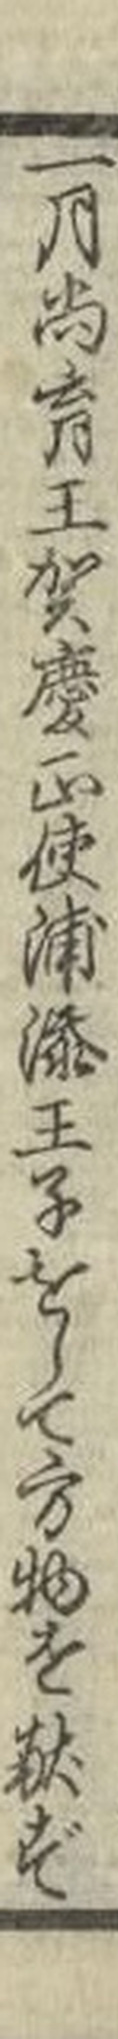一月尚育王賀慶正使浦添王子をして方物を献ず
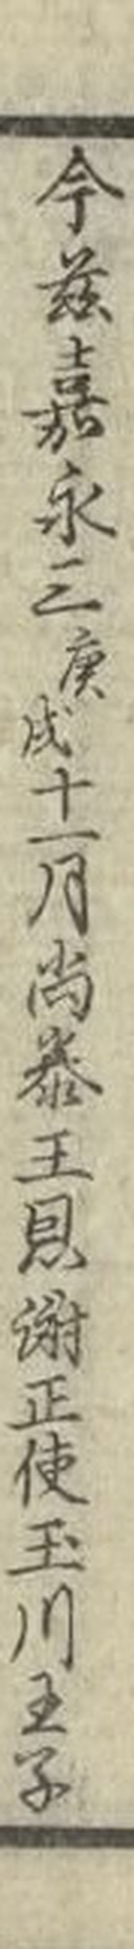今茲嘉永三庚戌十一月尚泰王恩謝正使玉川王子
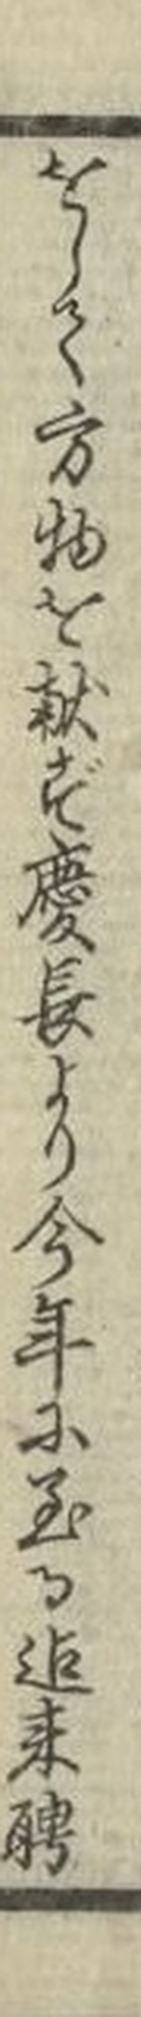をして方物を献ず慶長より今年に至る迄来聘
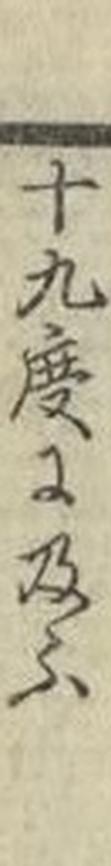十九度に及ふ
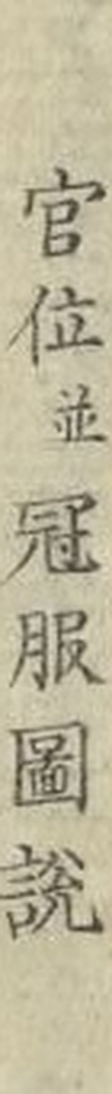官位並冠服図説
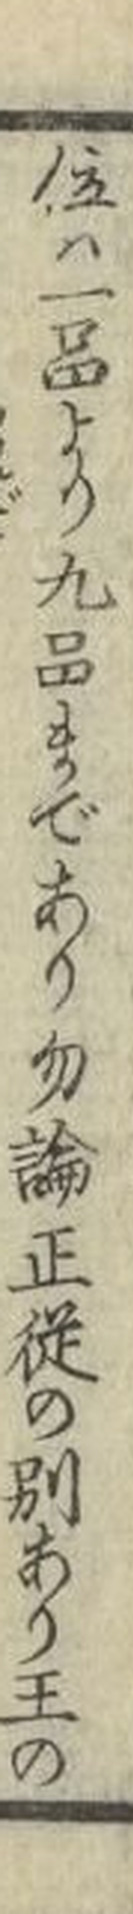位は一品より九品まであり勿論正従の別あり王の
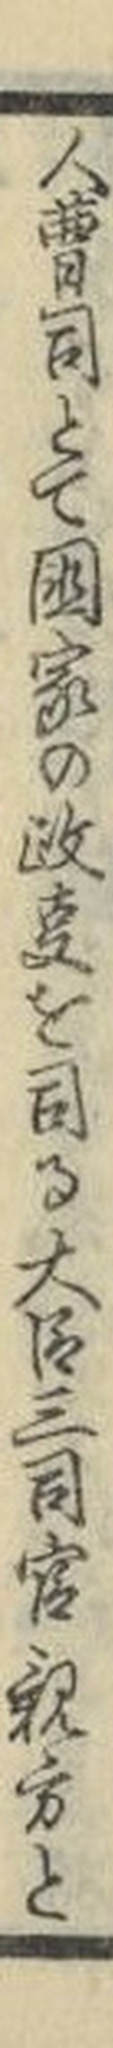人曹司とて国家の政事を司る大臣三司官親方と
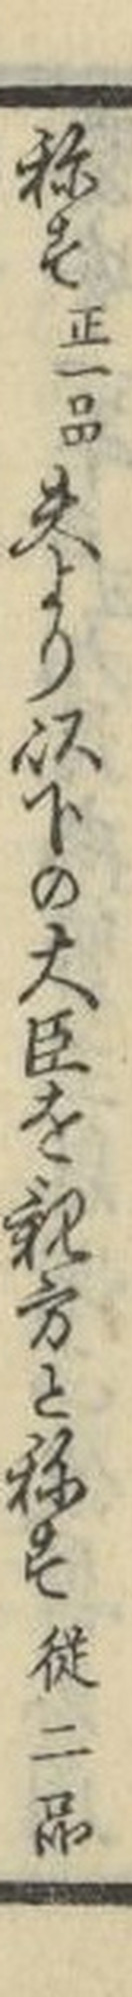称す正一品夫より以下の大臣を親方と称す従二品
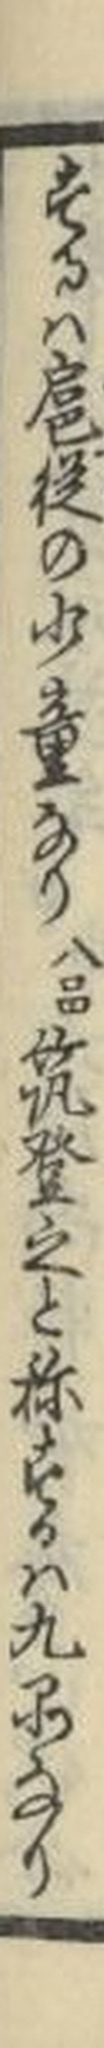するは扈従の少童なり八品筑登之と称するは九品なり
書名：琉球解語
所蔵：University of the Ryukyus Library
